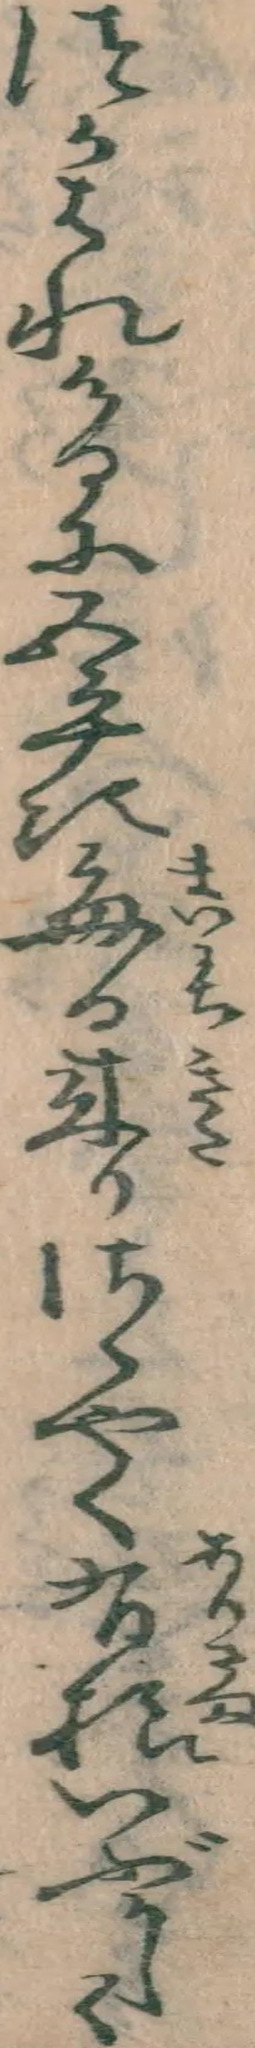つかはれけるに五平次毎日来りさゝやく有様いぶかしく
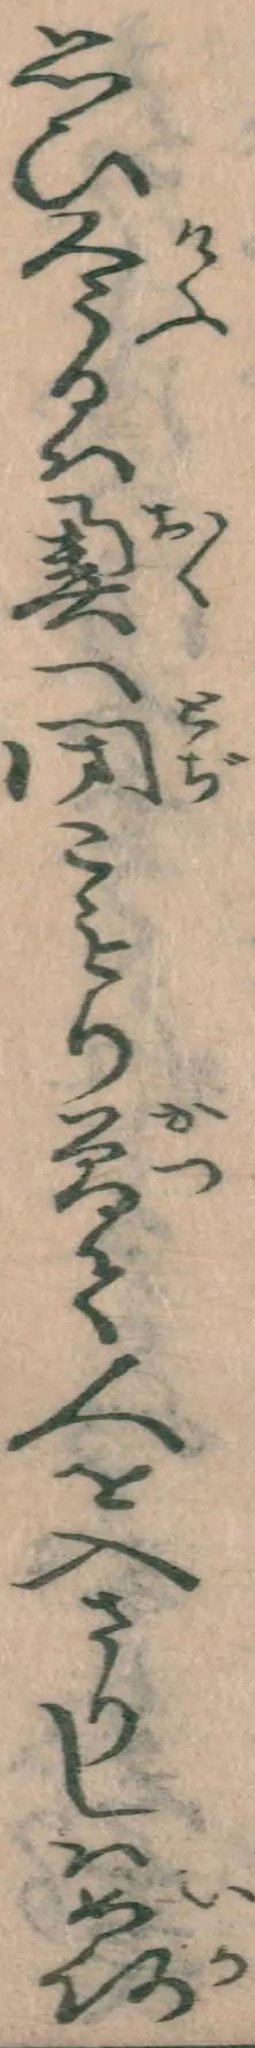思ひ今日は奥へ閉こもり曽て人を入さりしは如何
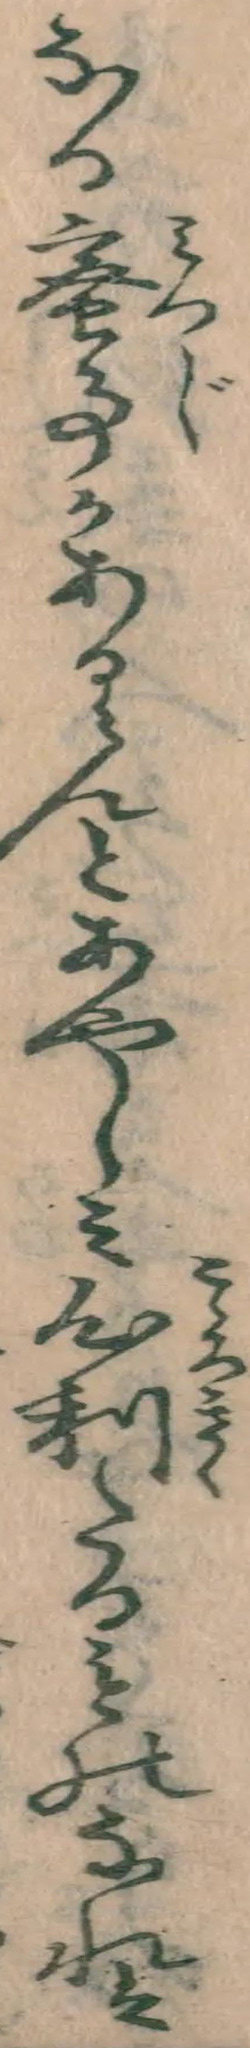なる密事かあるらんとあやしみ心利たるものなれは
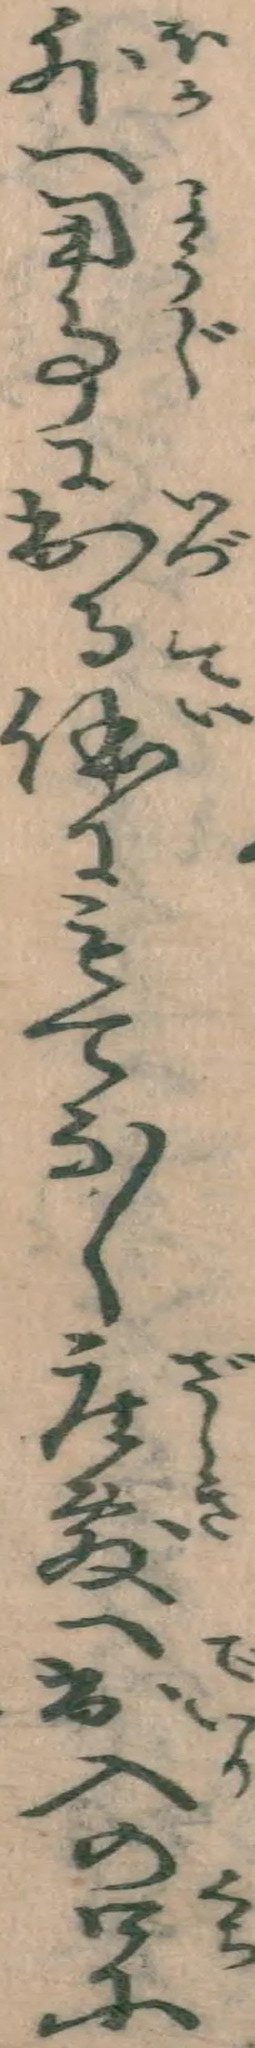外へ用事に出る体にもてなし座敷へ出入の口に
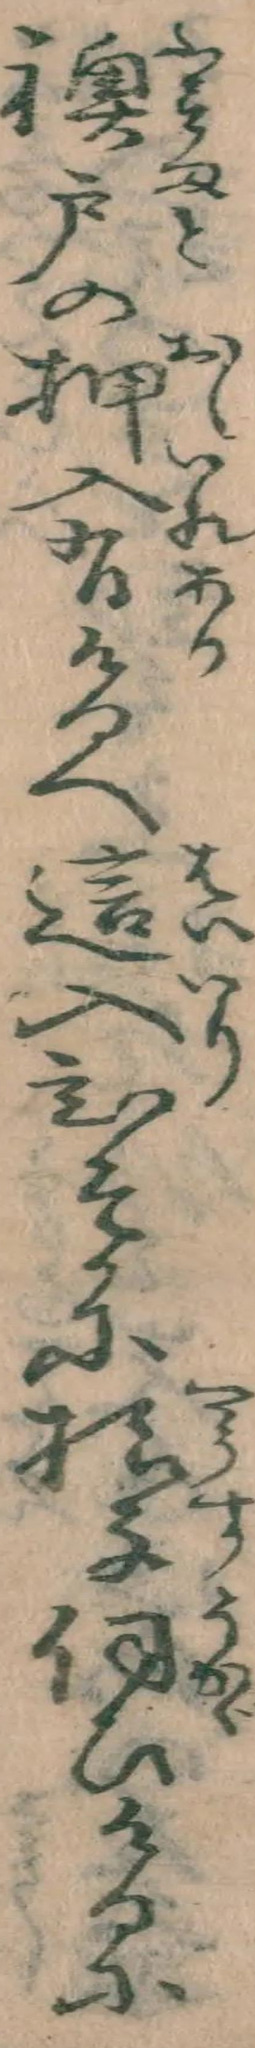襖戸の押入有けるへ這入ひそかに様子伺ひけるに
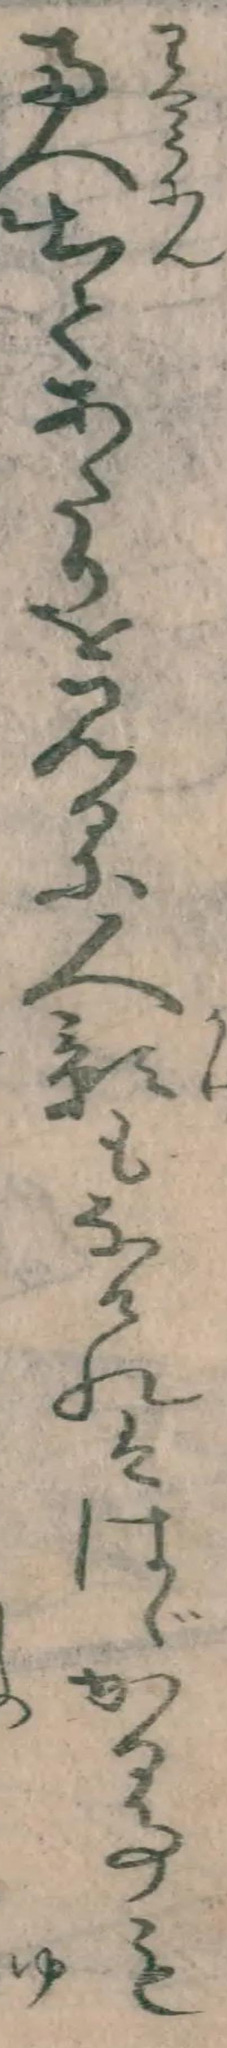両人出てあたりを見るに人影もなけれははゞかる事も
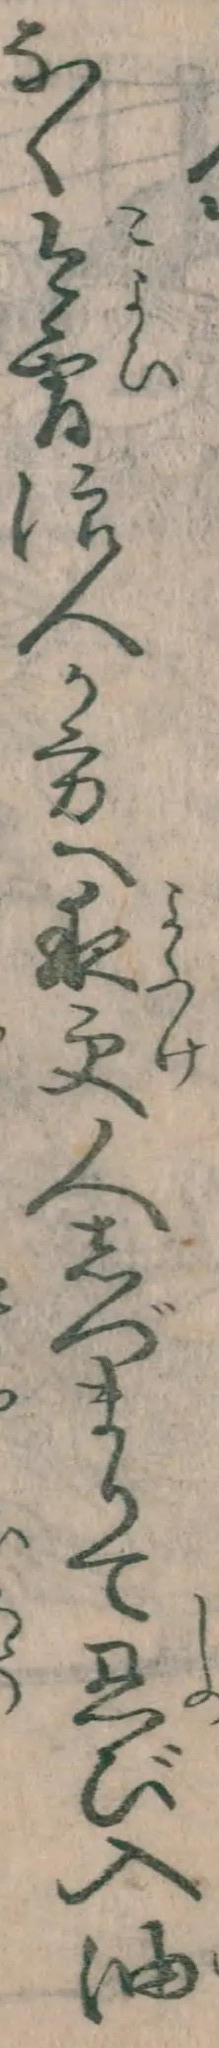なく今宵浪人か方へ夜更人しづまりて忍び入油
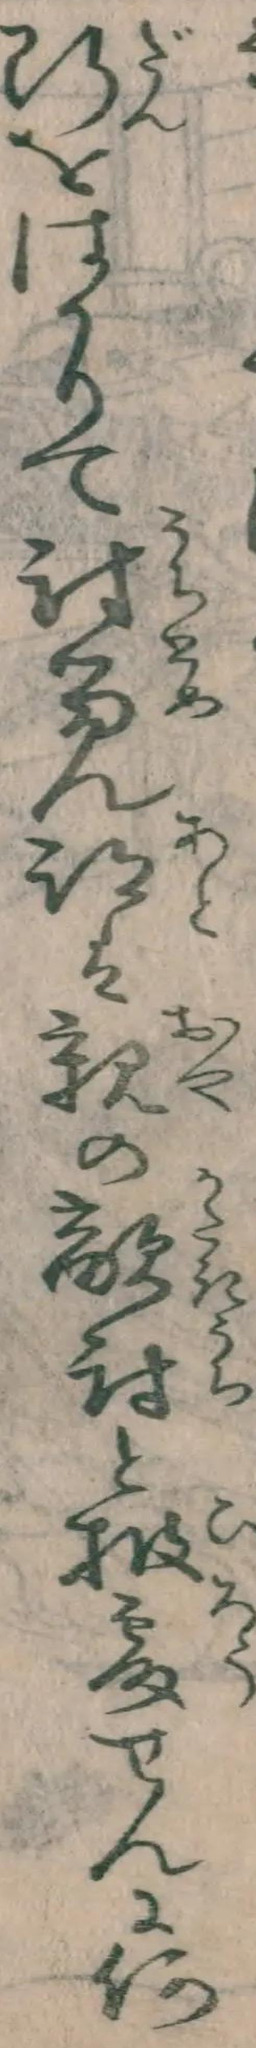断をはかりて討留ん跡は親の敵討と披露せんに何
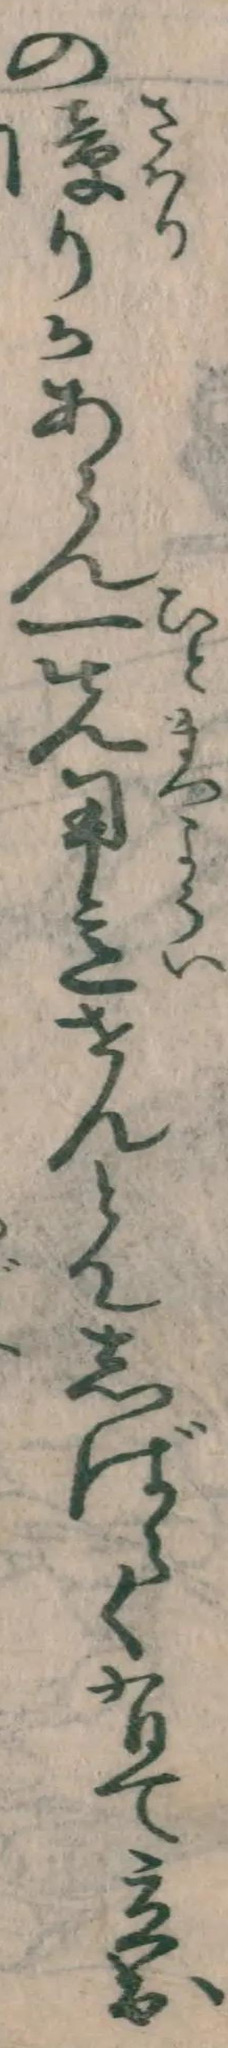の障りかあらん一先用意せんとてしばらく有て立出
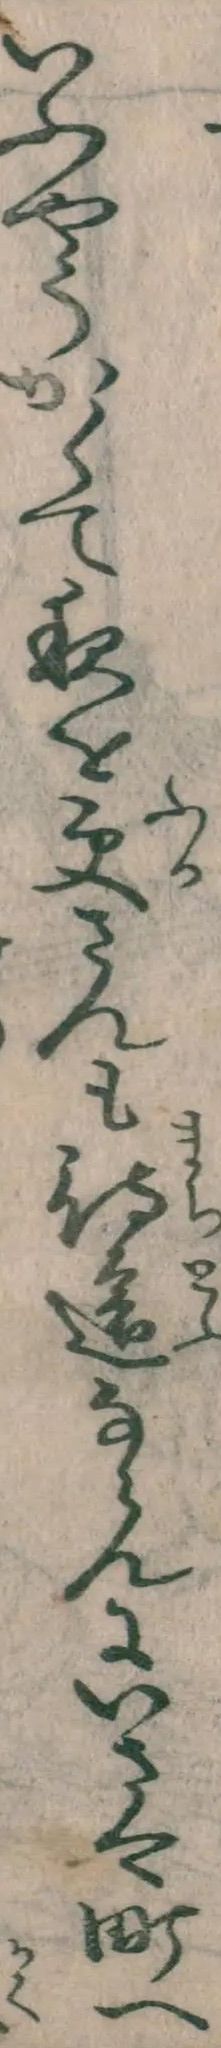いふやうかくて夜を更さんも待遠ならんにいさや町へ
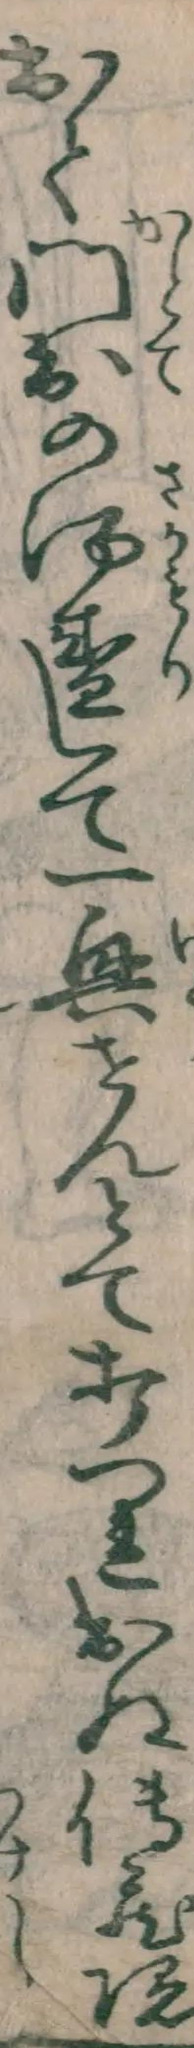出て門出の酒盛して一興せんとて打つれ出ぬ伝蔵隠
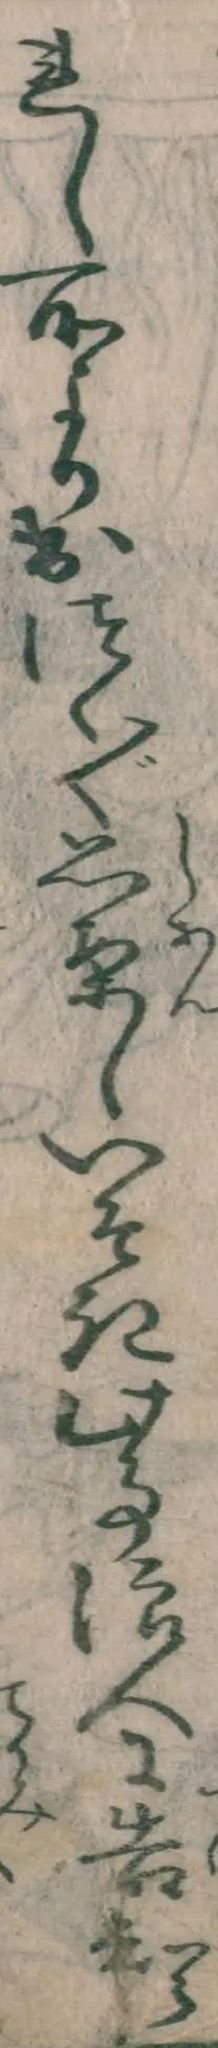れし所より出つく〴〵思案しいそき此事浪人に告知ら
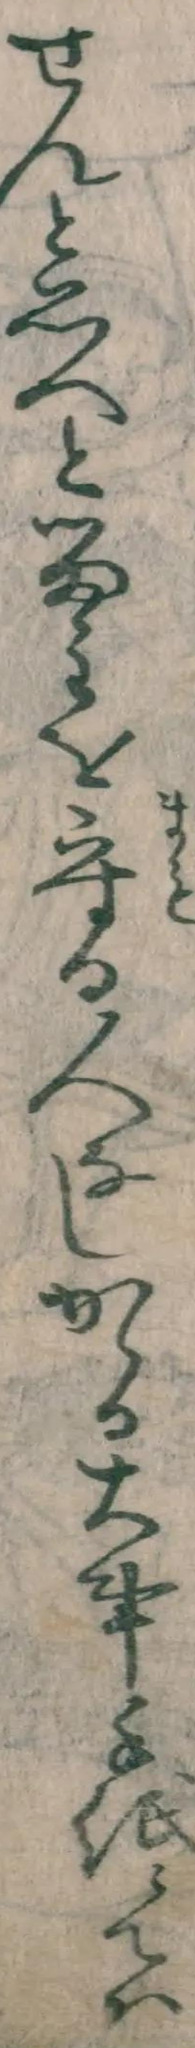せんと思へと留主を守る人なしかゝる大事手紙にては
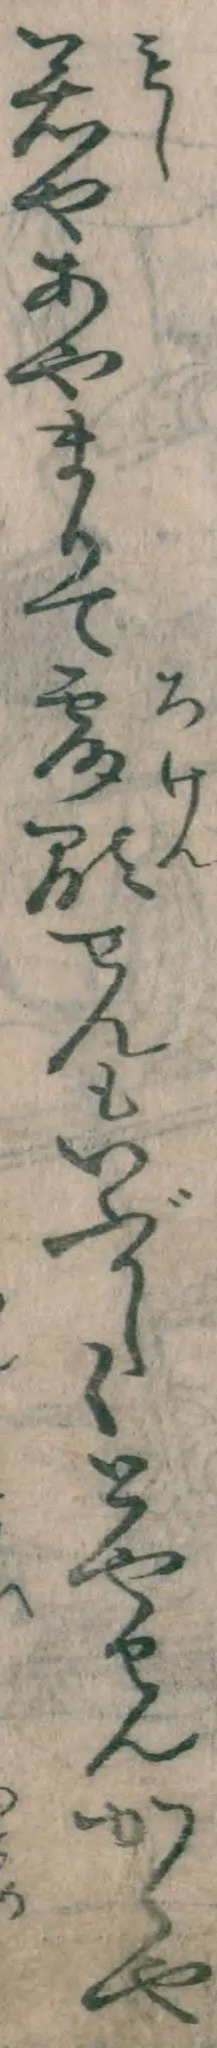若やあやまりて露顕せんもいぶかしくとやせんかくや
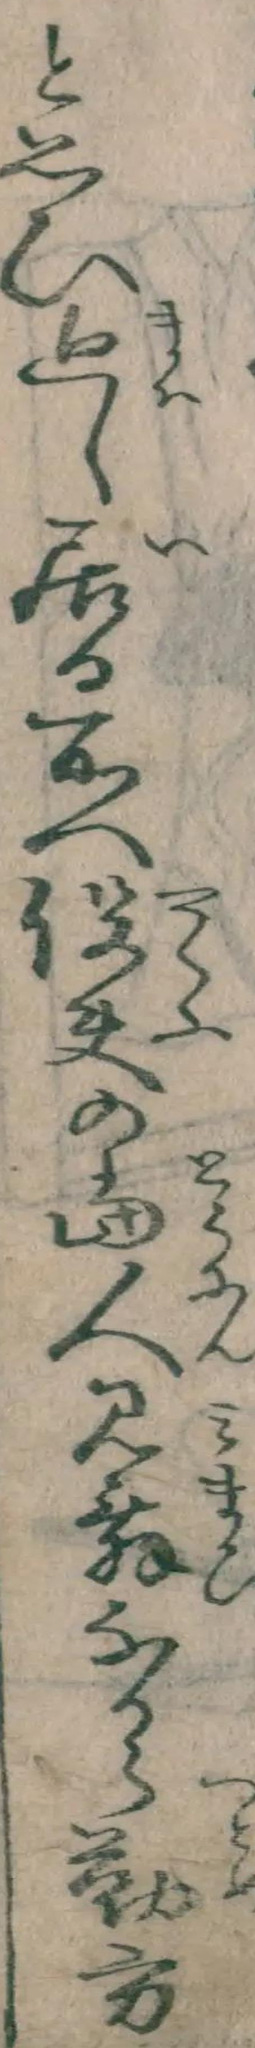と思ひ廻し居る所へ役夫の当人見舞なから勤方

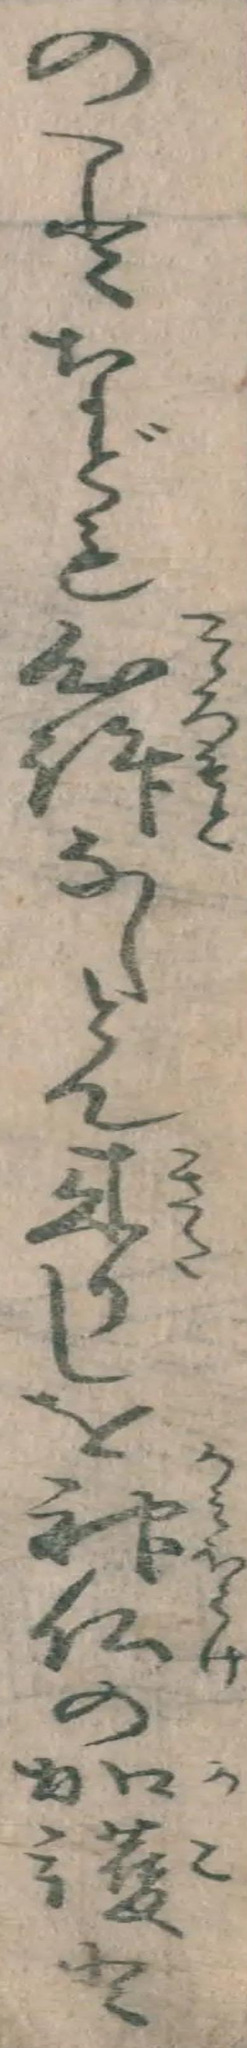のことなども心許なしとて来りしを神仏の加護と
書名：怪談御伽童 5巻. [2]
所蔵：国立国会図書館 National Diet Library, JAPAN
